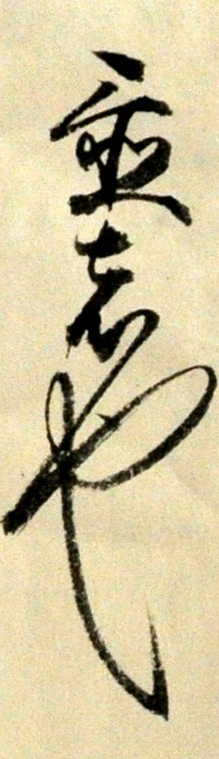置者也
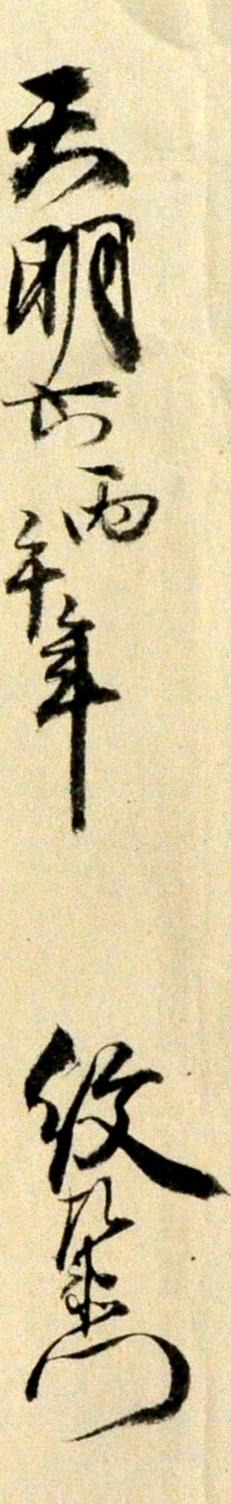天明六丙午年紋左衛門
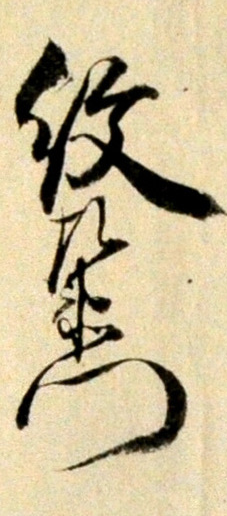藤右衛門
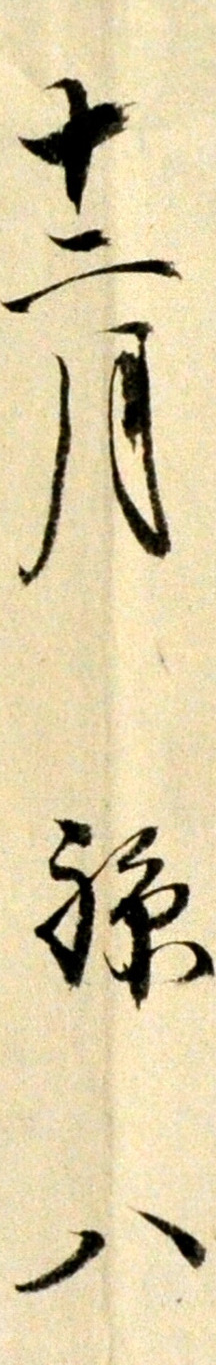十二月孫八
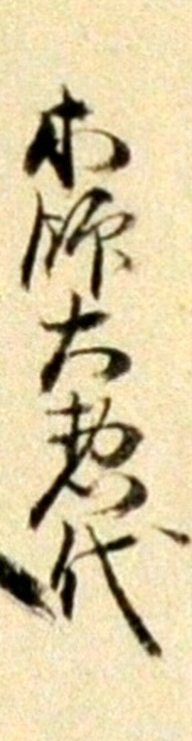木師大惣代
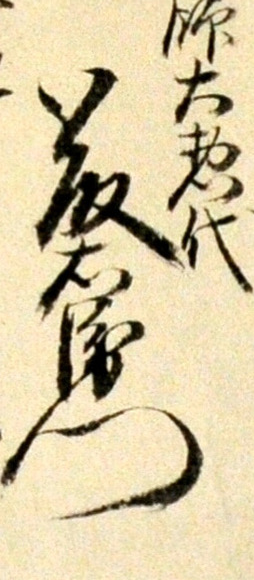藤右衛門
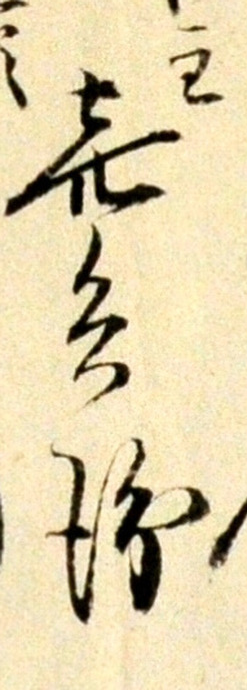喜兵衛
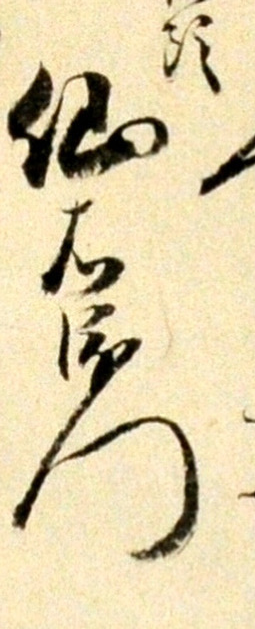仙右衛門
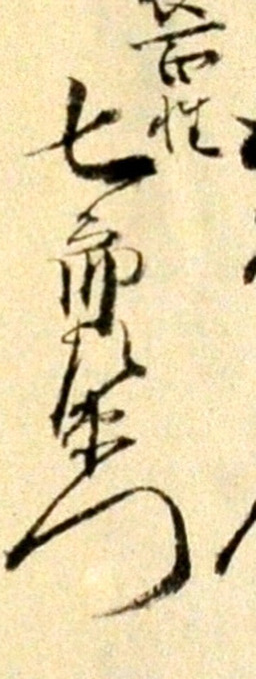治郎左衛門
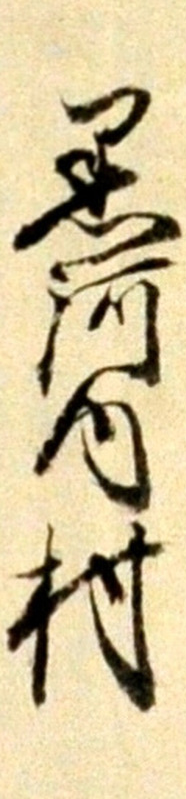黒河内村
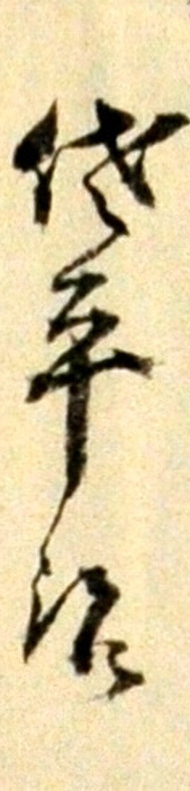佐平治
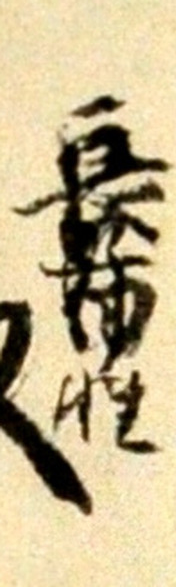長百性
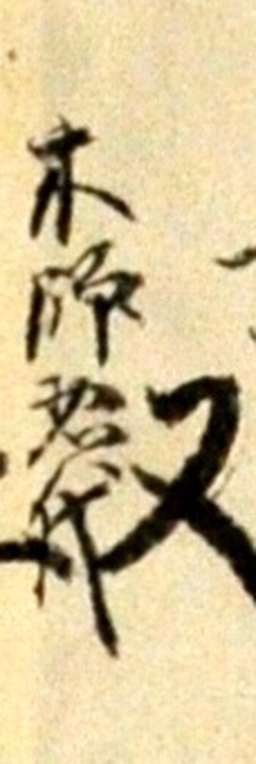木師惣代
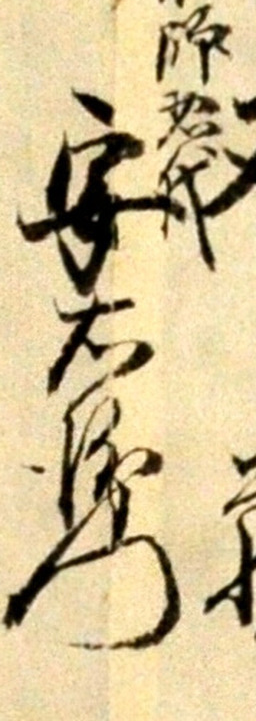安右衛門
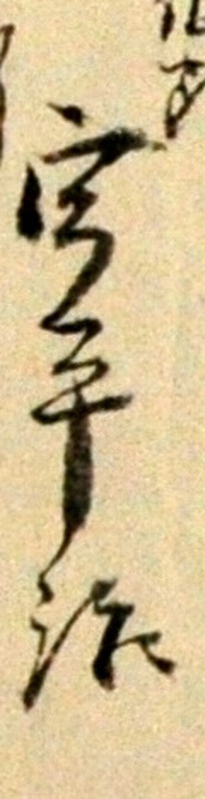佐平治
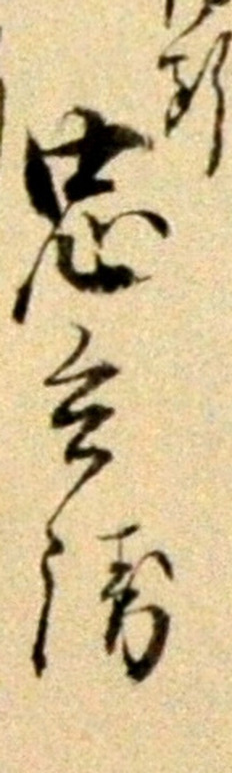喜兵衛
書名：木師郷御定書（写）
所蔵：伊那市立高遠町図書館・合同会社AMANE
